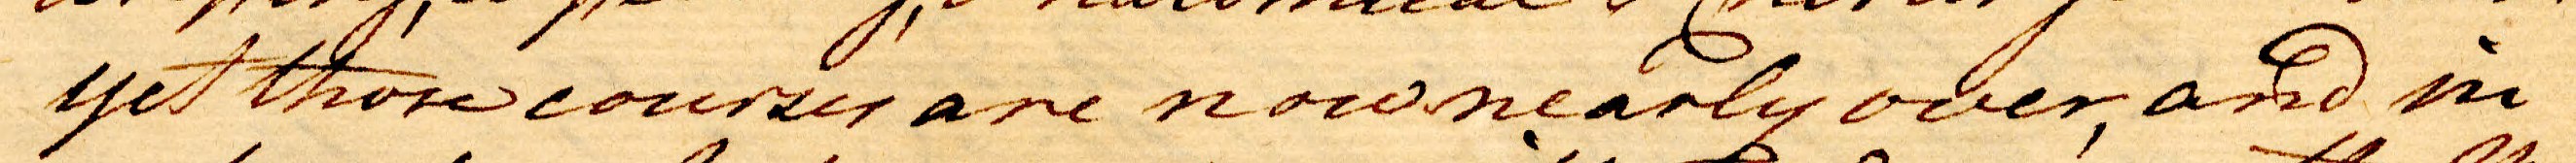yet those courses are now nearly over, and in
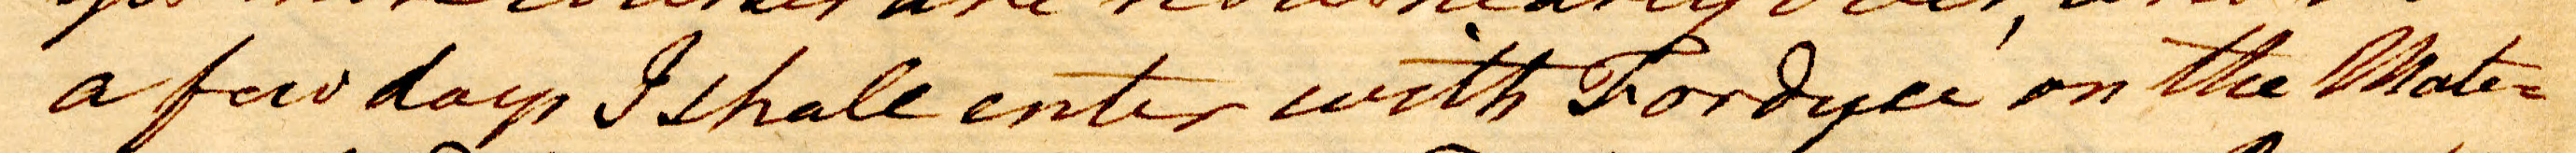a few days I shall enter with Fordyce on the Mate-
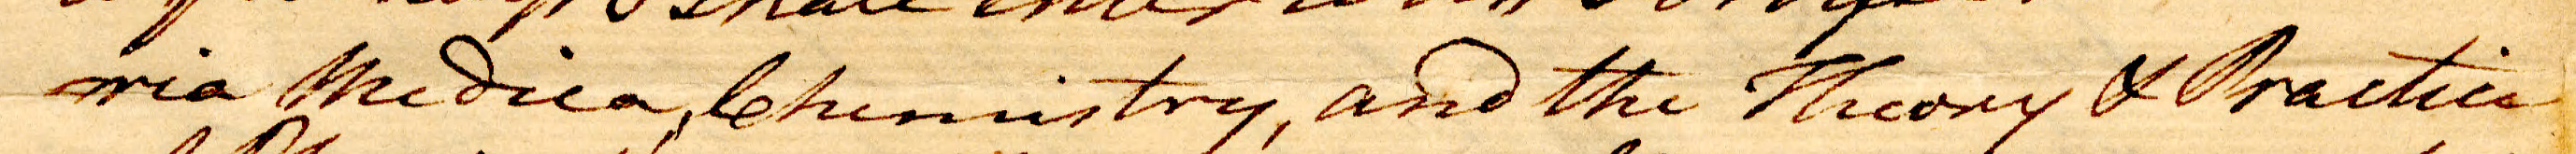-ria Medica, Chemistry, and the Theory & Practice
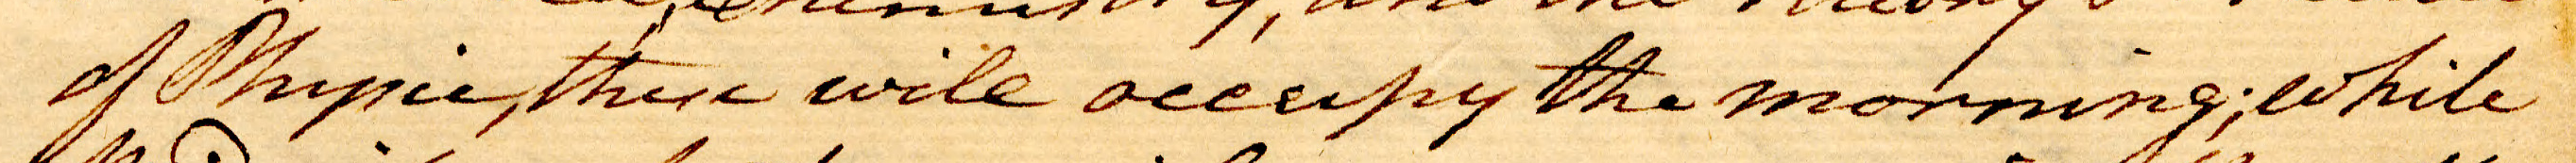of Physic, these will occupy the morning; while
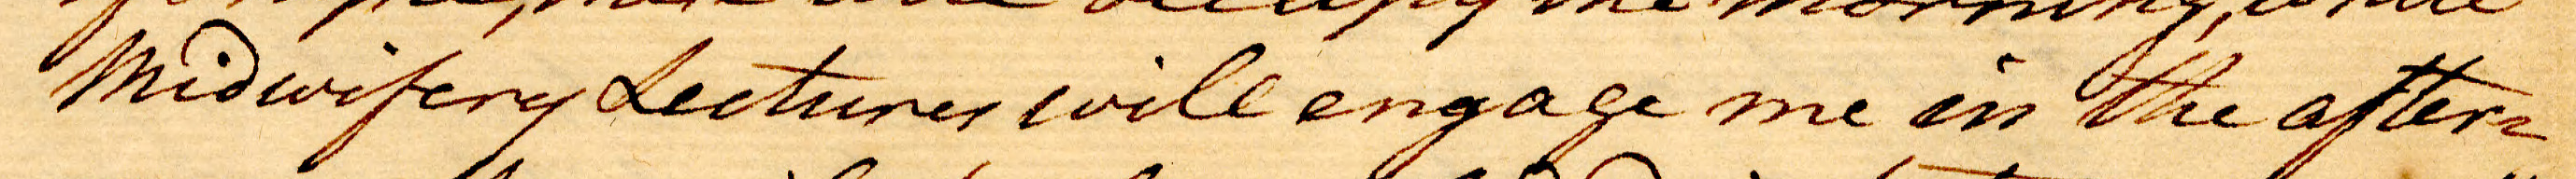Midwifery Lectures will engage me in the after-
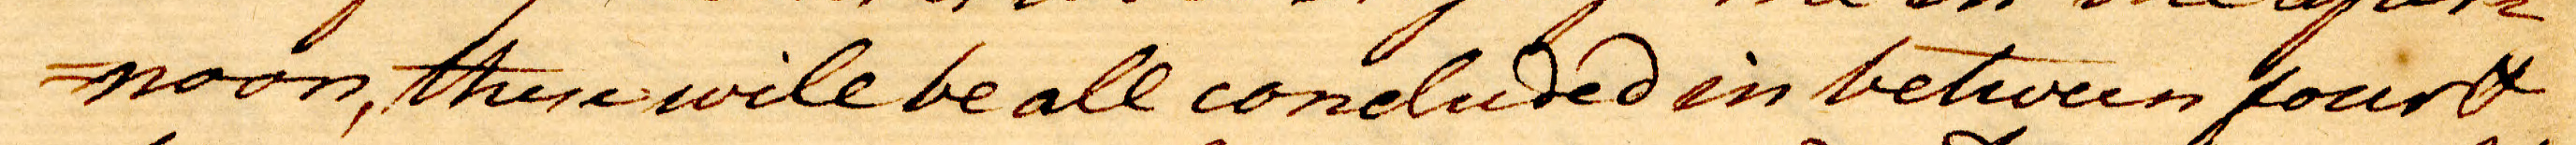-noon, these will be all concluded in between four &
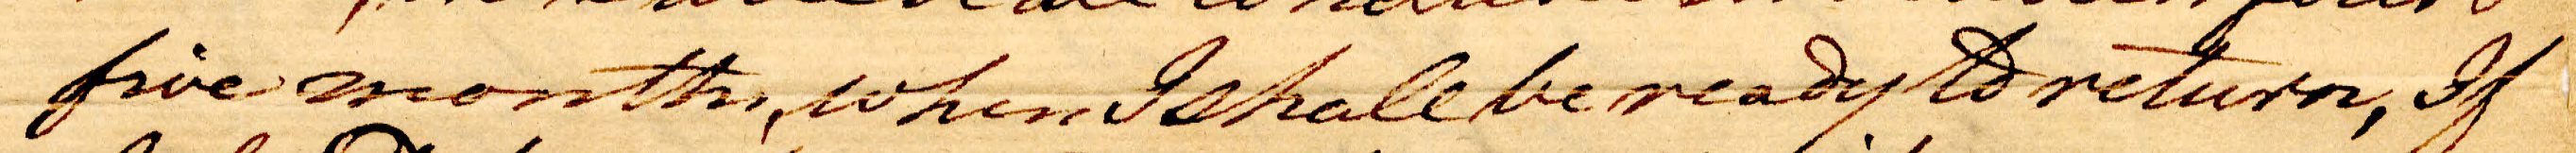five months, when I shall be ready to return, If
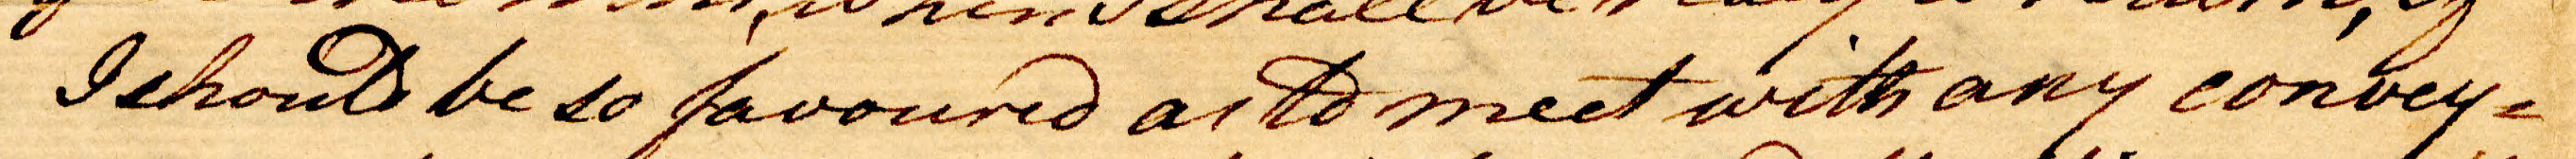I should be so favoured as to meet with any convey-
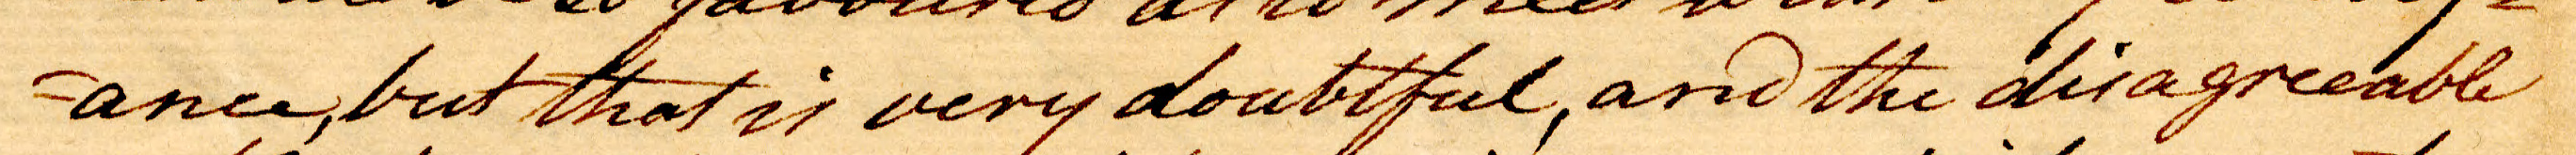-ance, but that is very doubtful, and the disagreeable
